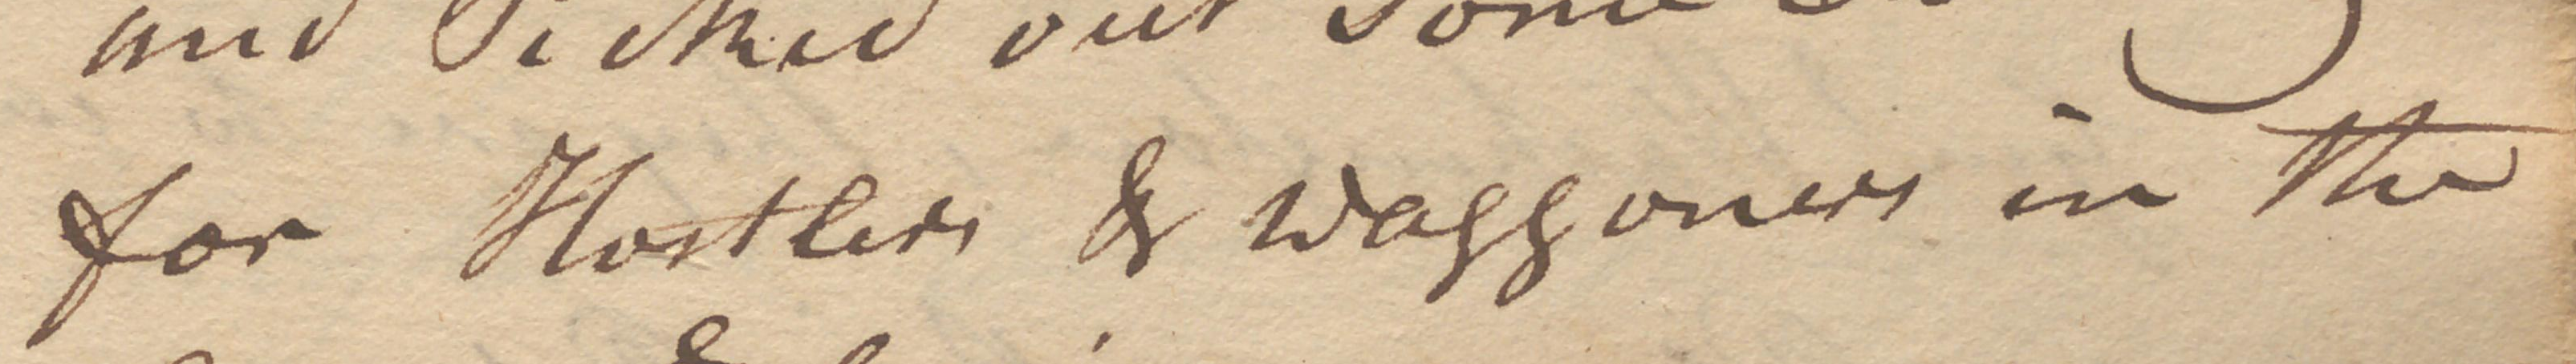for Hostlers & waggoners in the
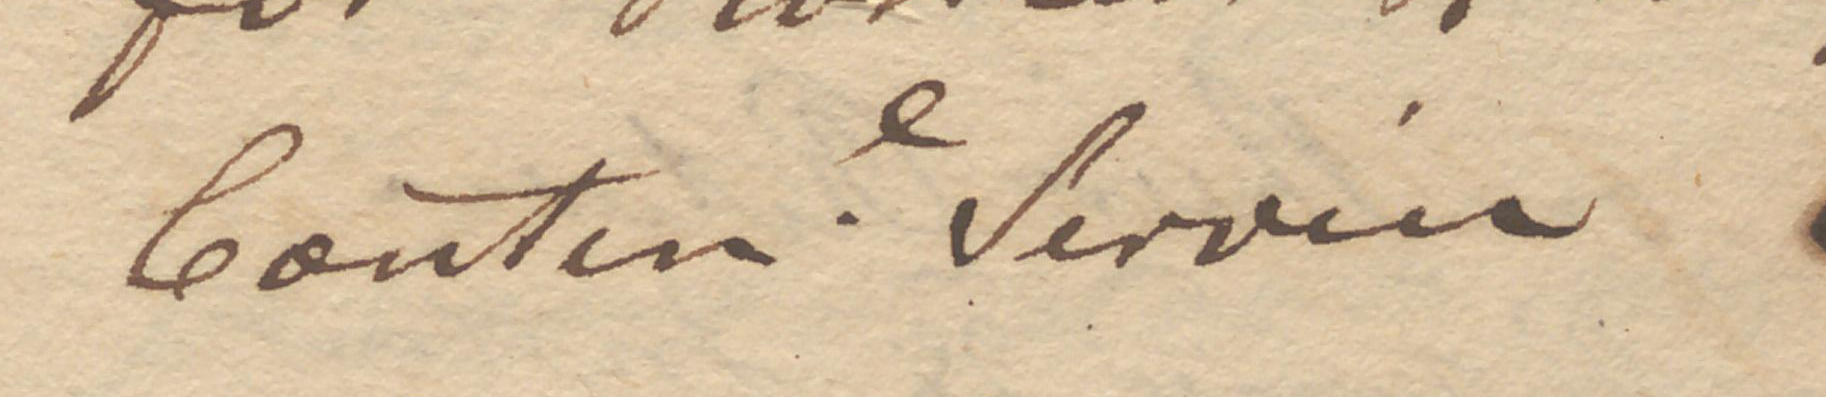Contin^l. Service
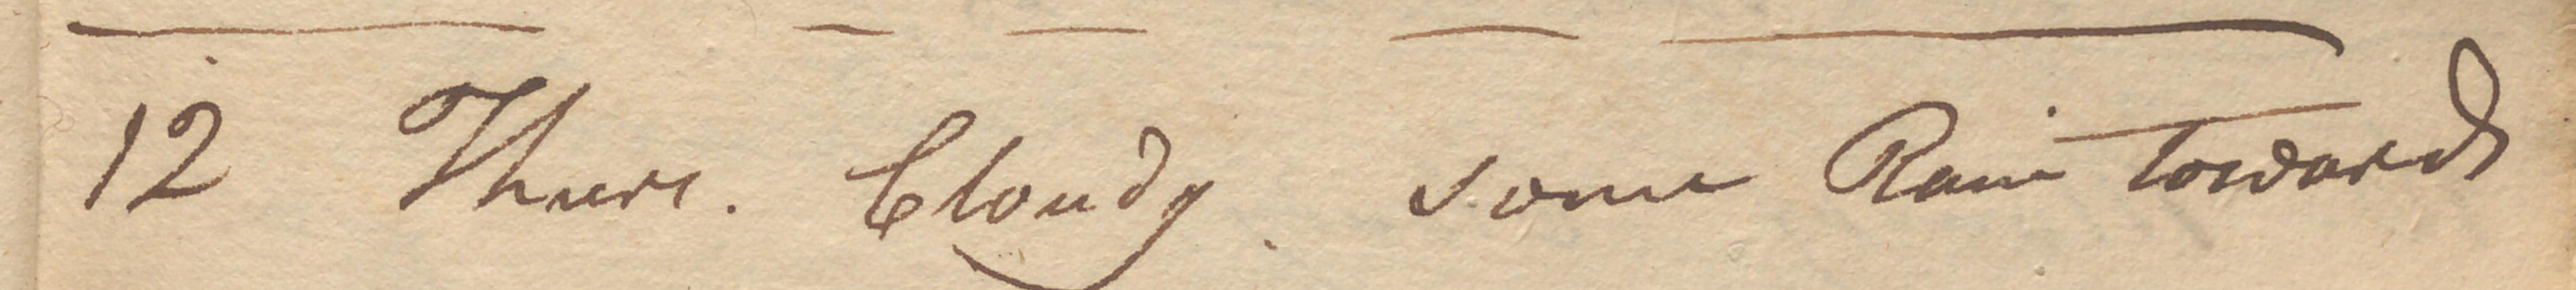12 Thurs. Cloudy some Rain towards
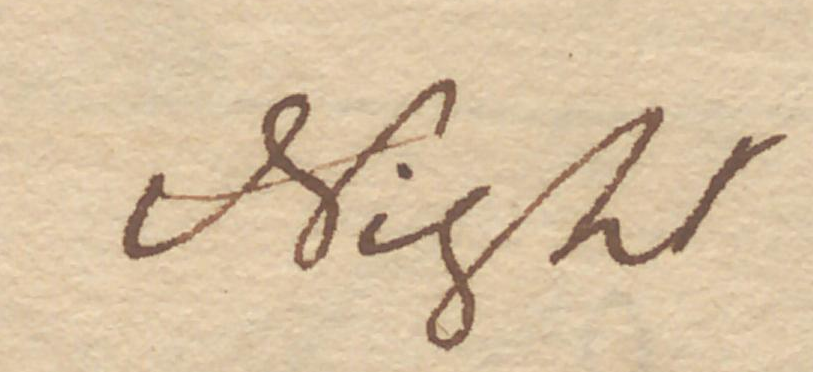Night
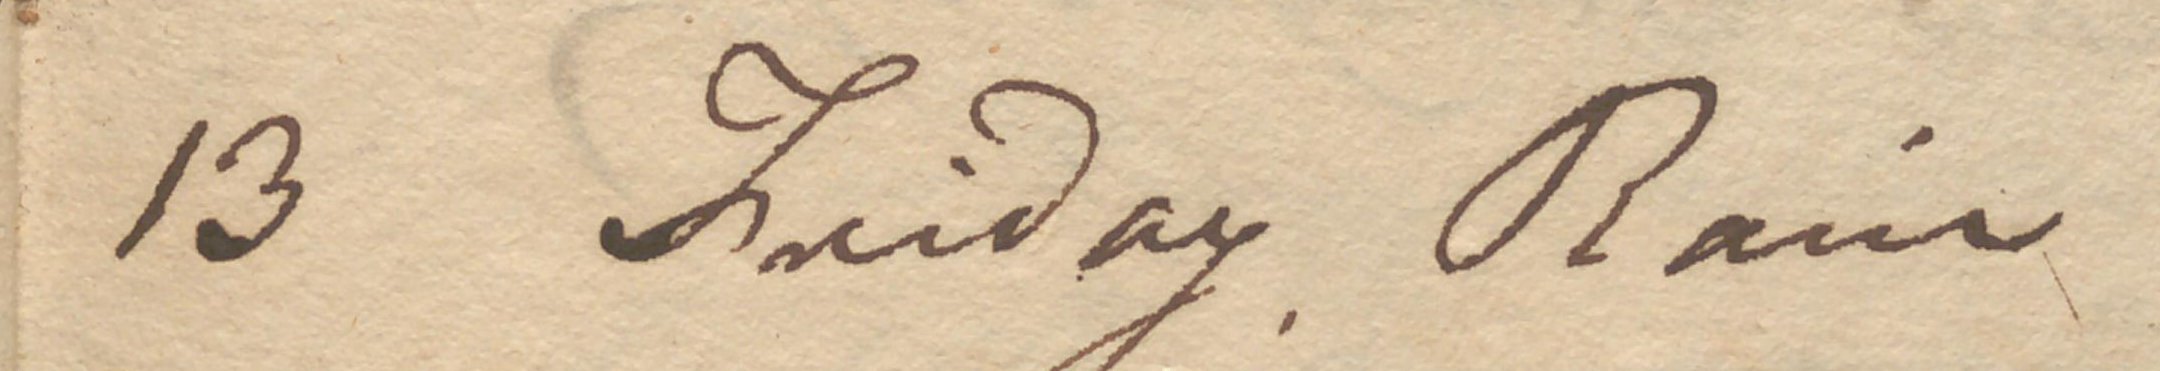13 Friday Rain
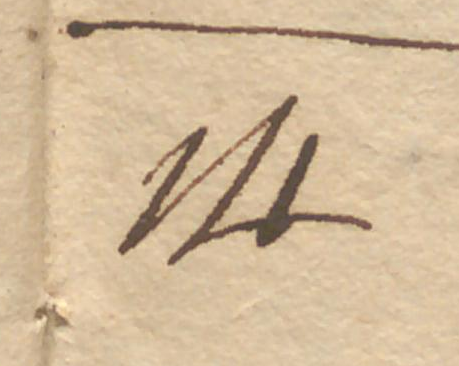141
